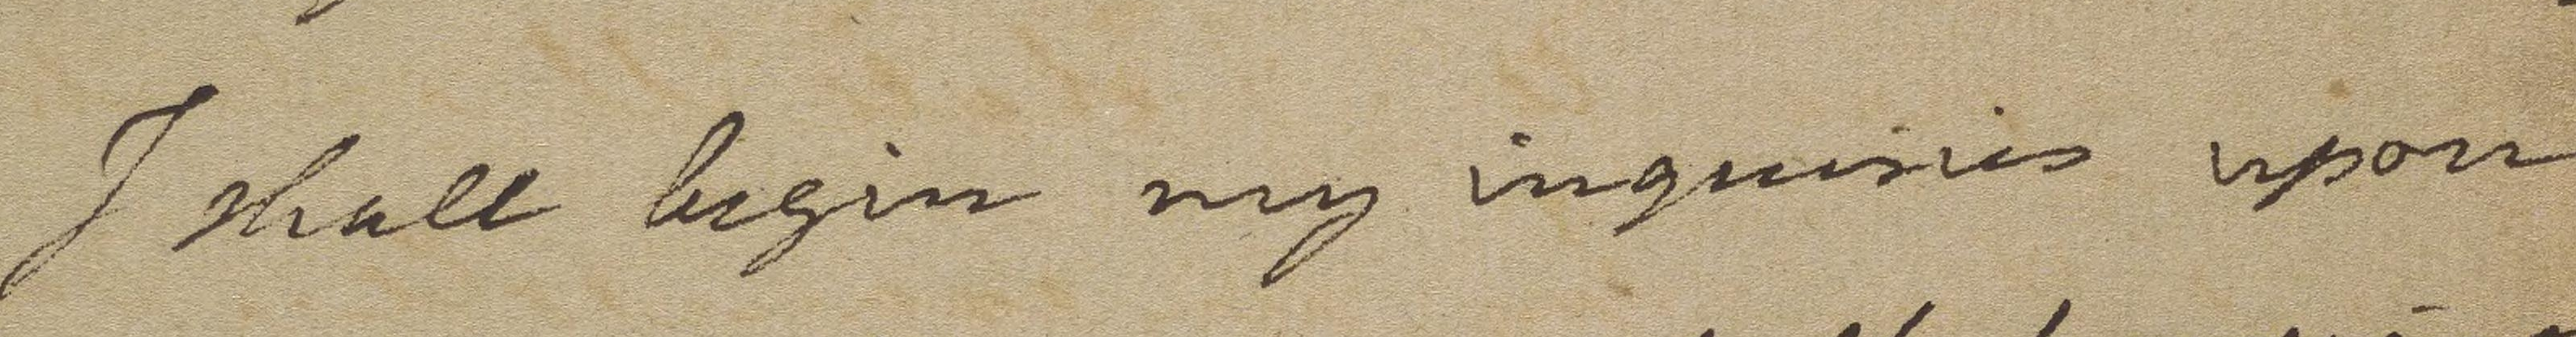I shall begin my inquiries upon
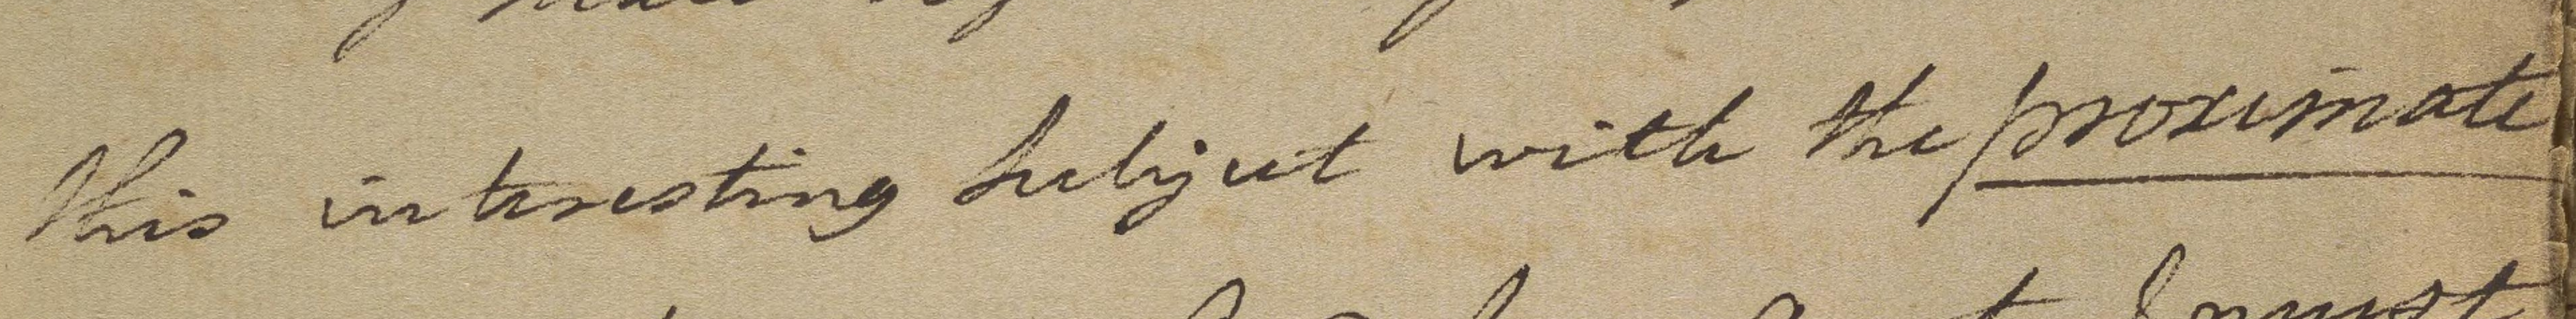this interesting subject with the proximate
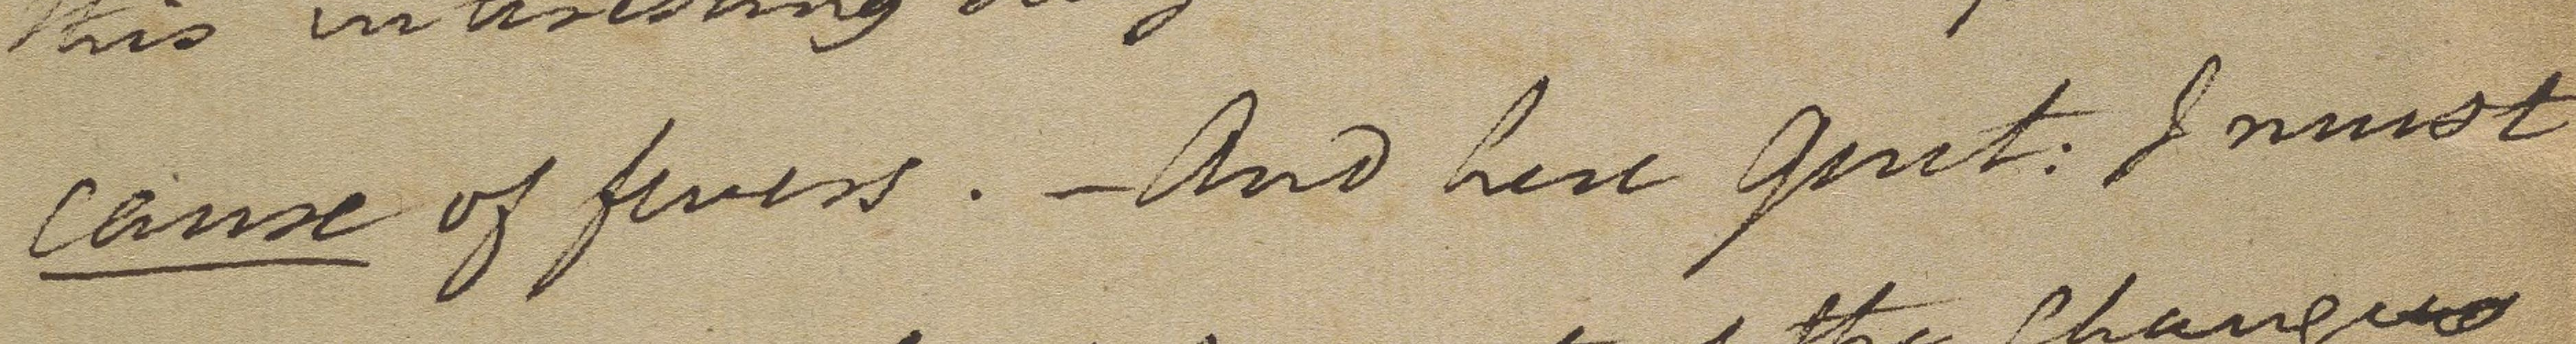cause of fevers.- And here gent: I must
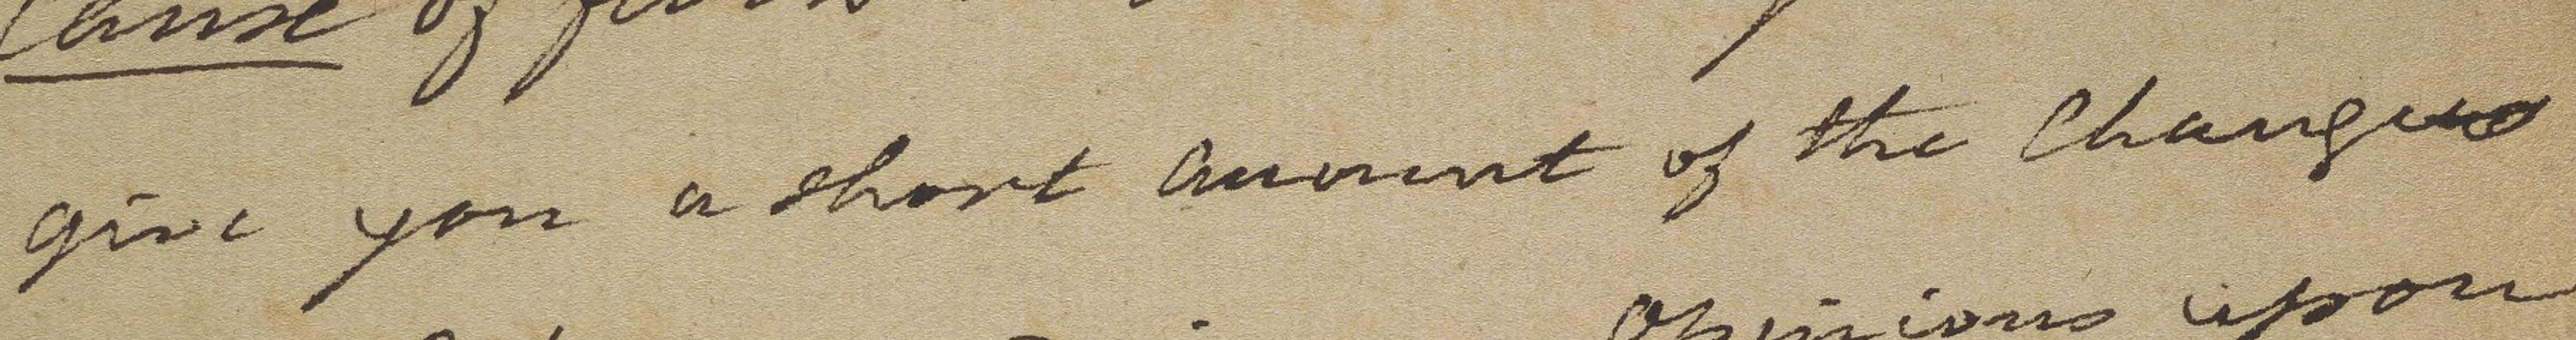give you a short account of the changes
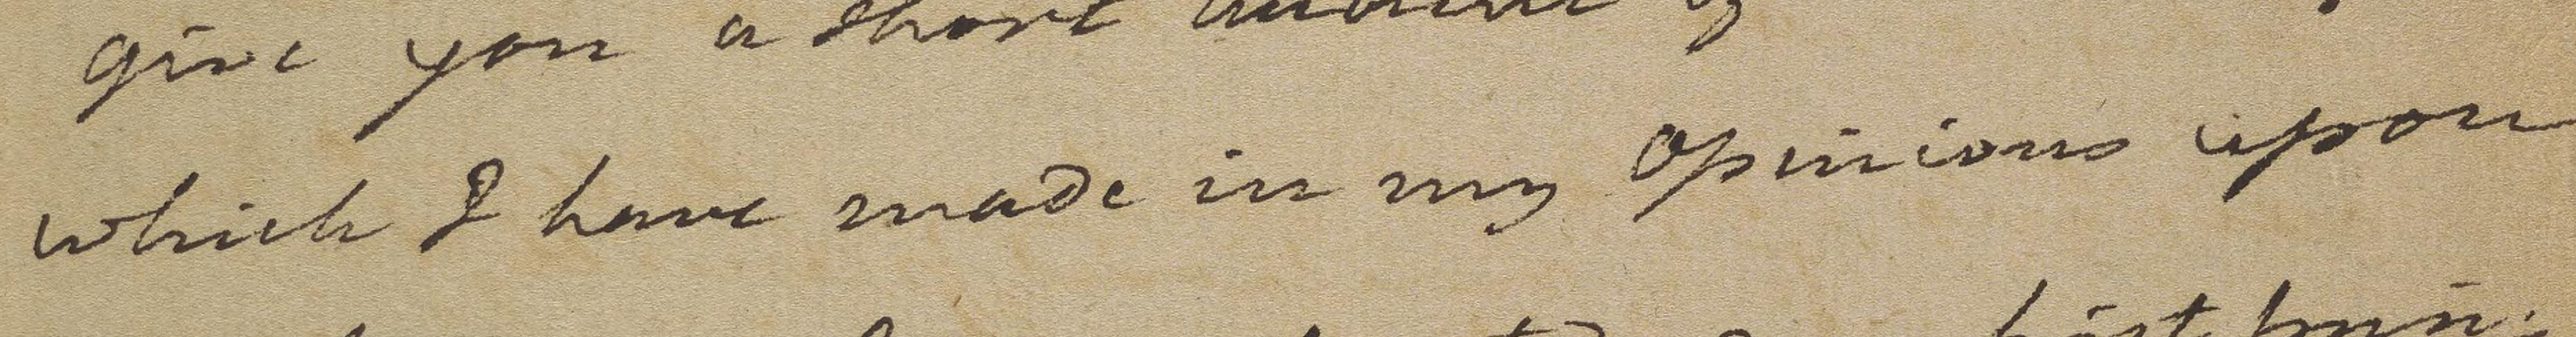which I have made in my opinions upon
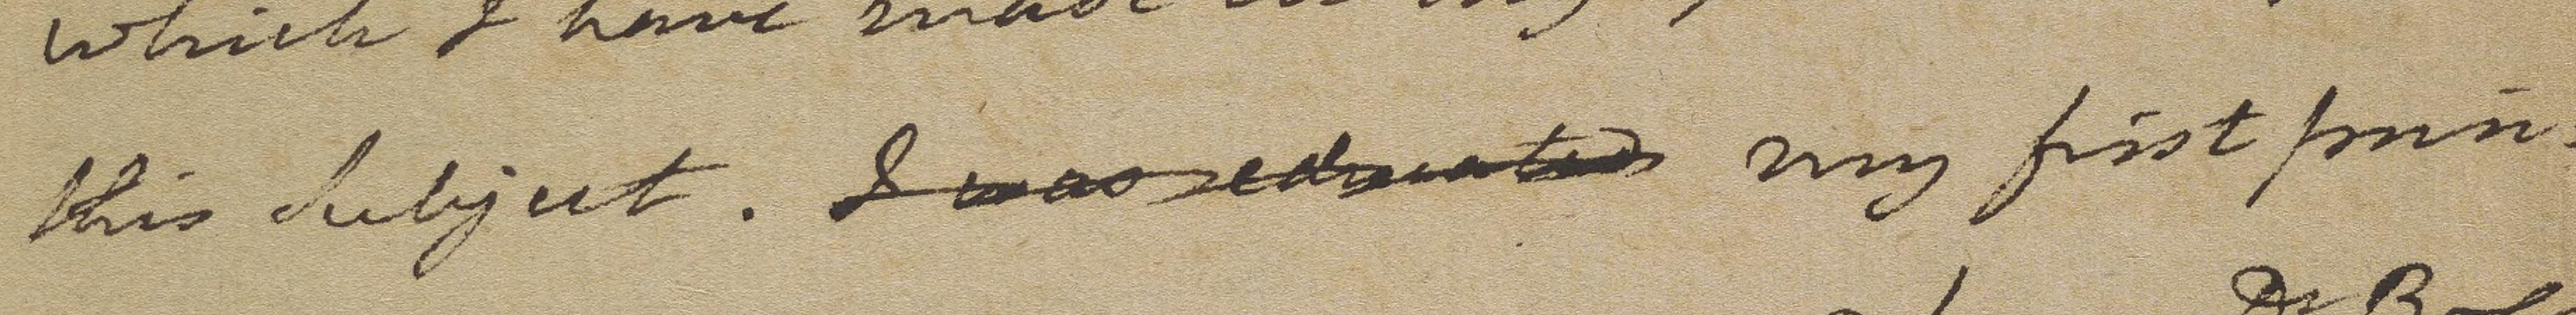this subject. [I was educated] my first prin-
